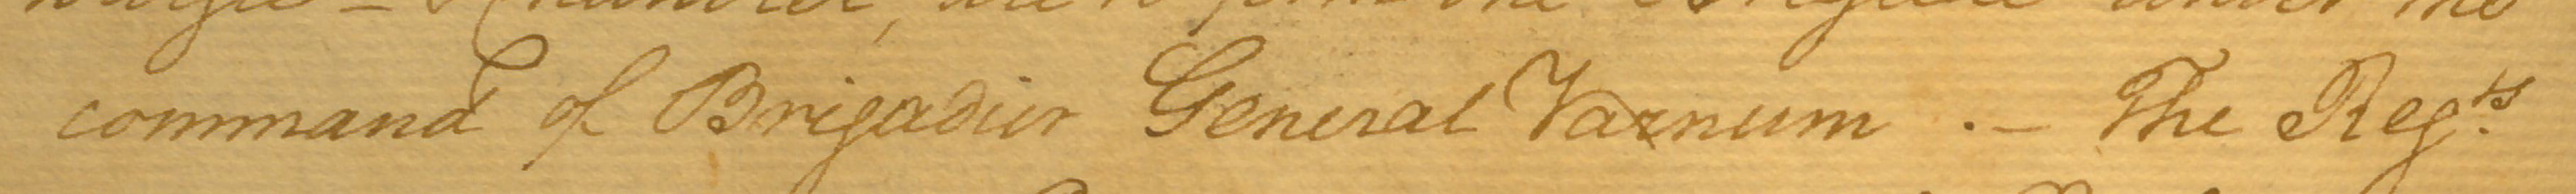command of Brigadier General Varnum.- The Reg^ts.
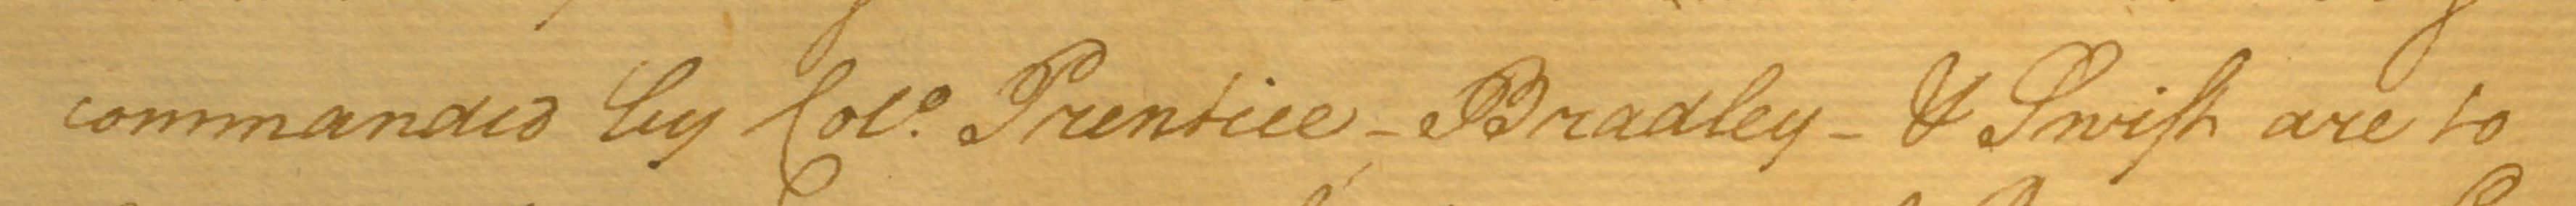commanded by Col^o. Prentice- Bradley- & Swift are to
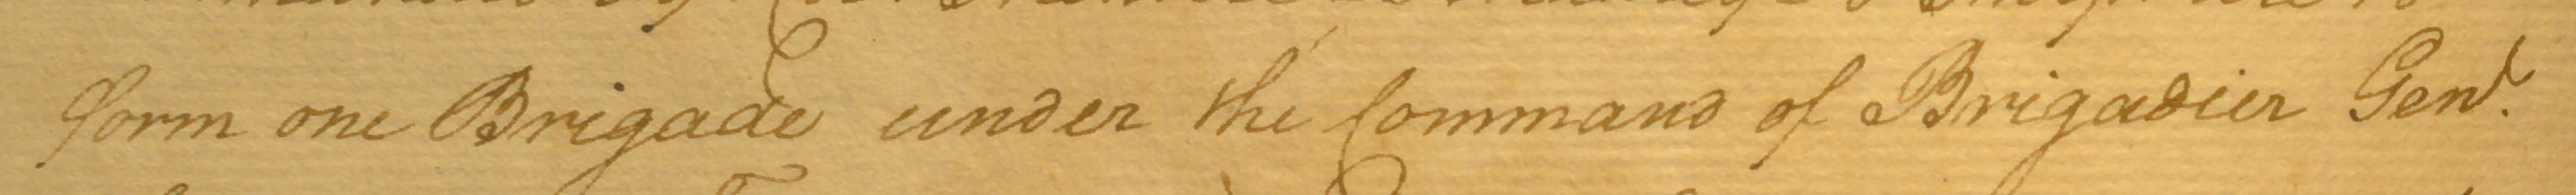form one Brigade under the Command of Brigadier Gen^l.
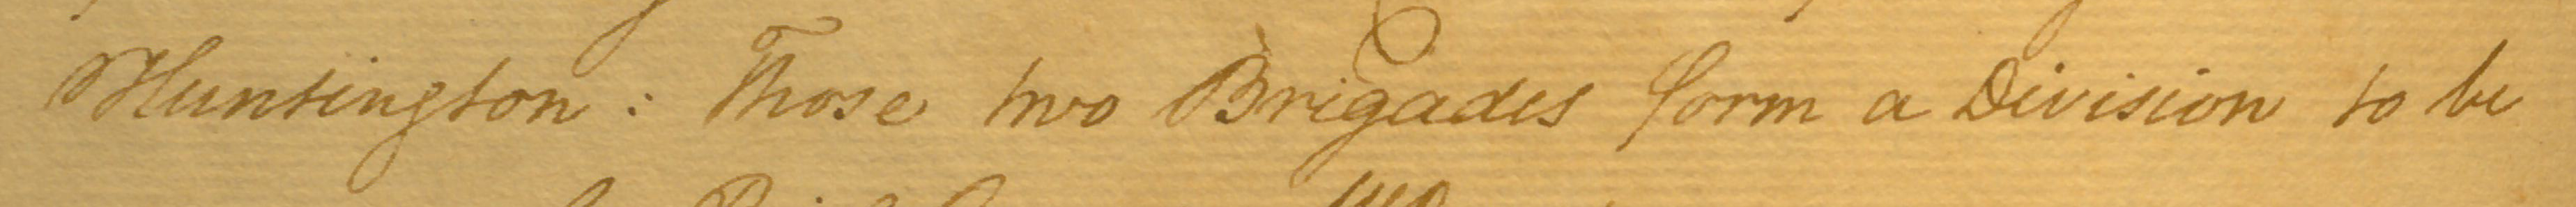Huntington: Those two Brigades form a Division to be
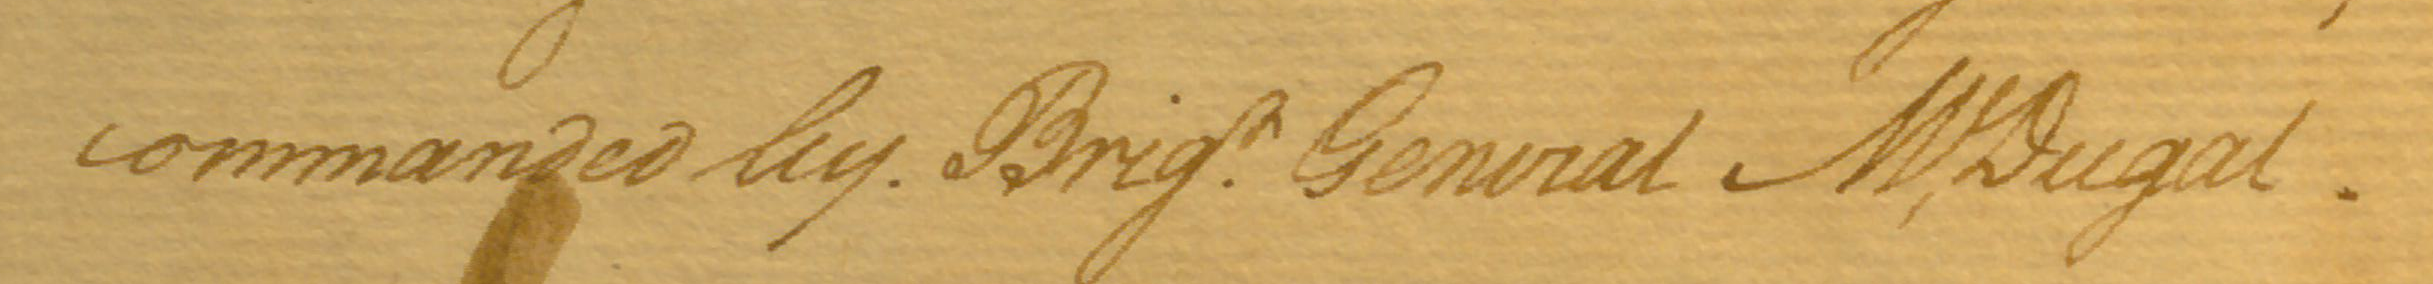commanded by Brig^r. General M^cDugal.
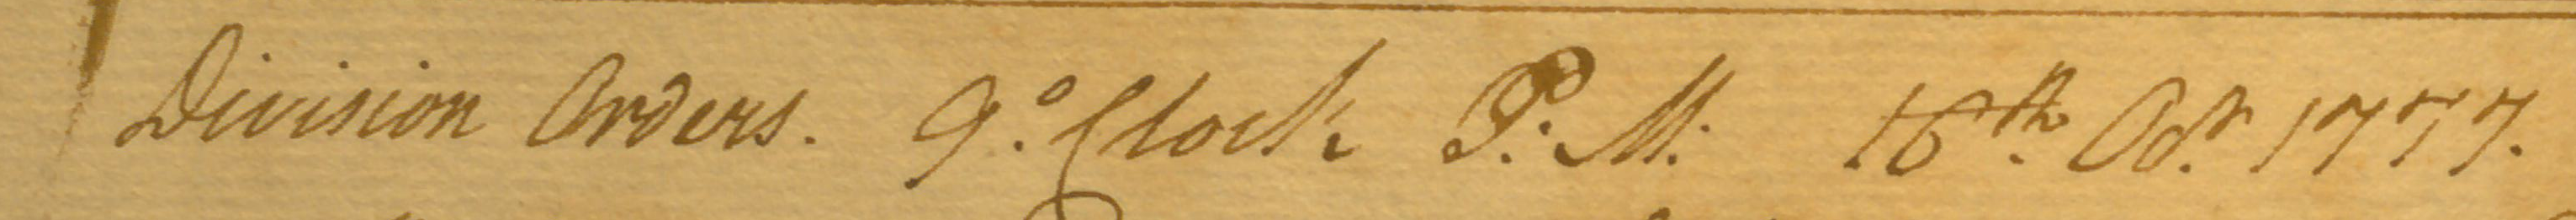Division Orders. 9. ^oClock P:M: 16^th. Oc^r. 1777.
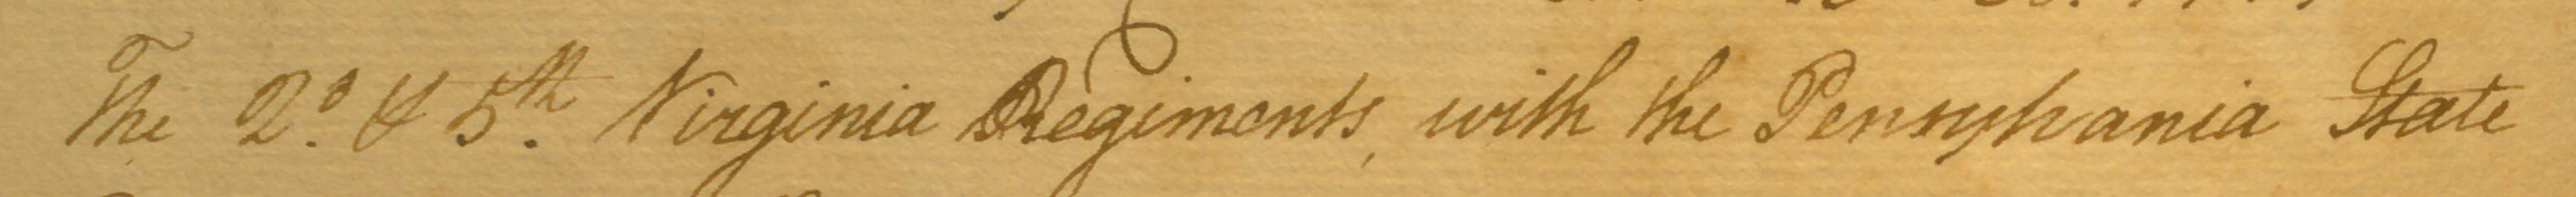The 2^d. & 5^th Virginia Regiments with the Pennsylvania State
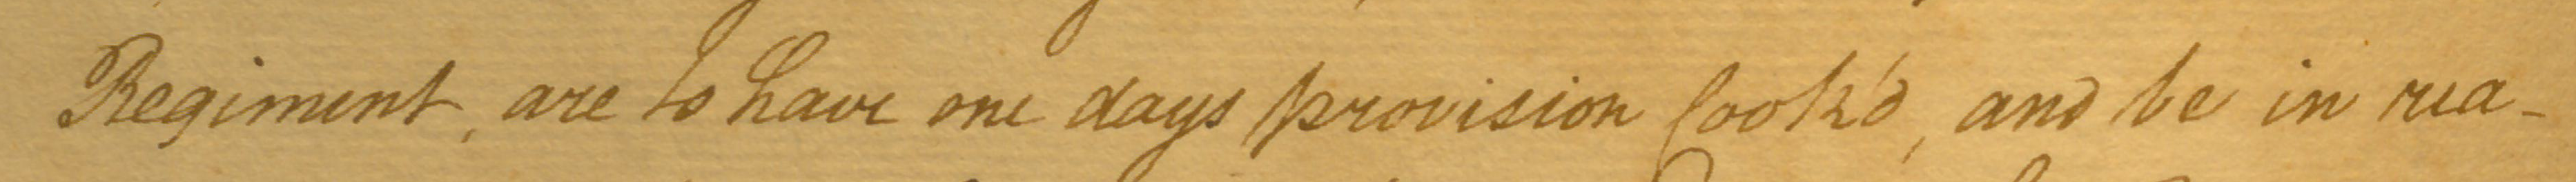Regiment, are to have one days provision Cook'd, and be in read-
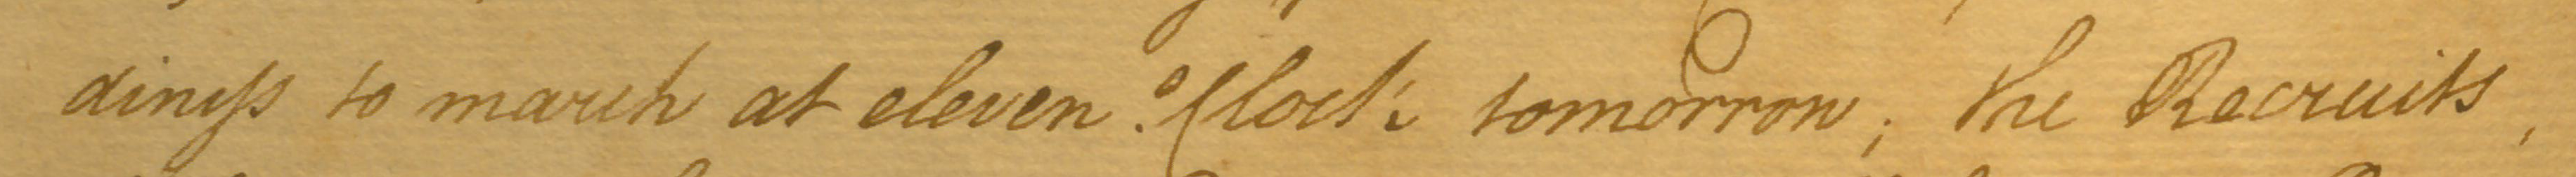diness to march at eleven ^o.Clock tomorrow; the Recruits
